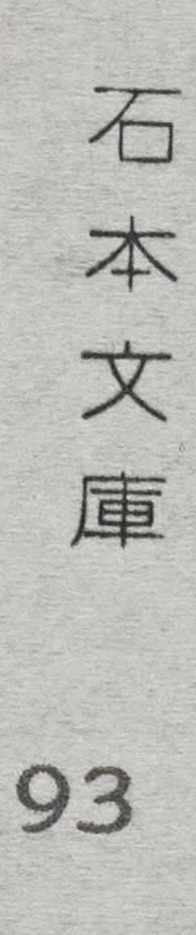石本文庫
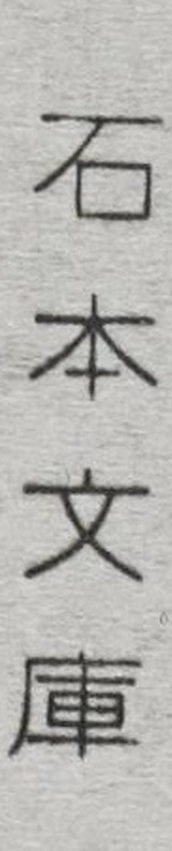石本文庫

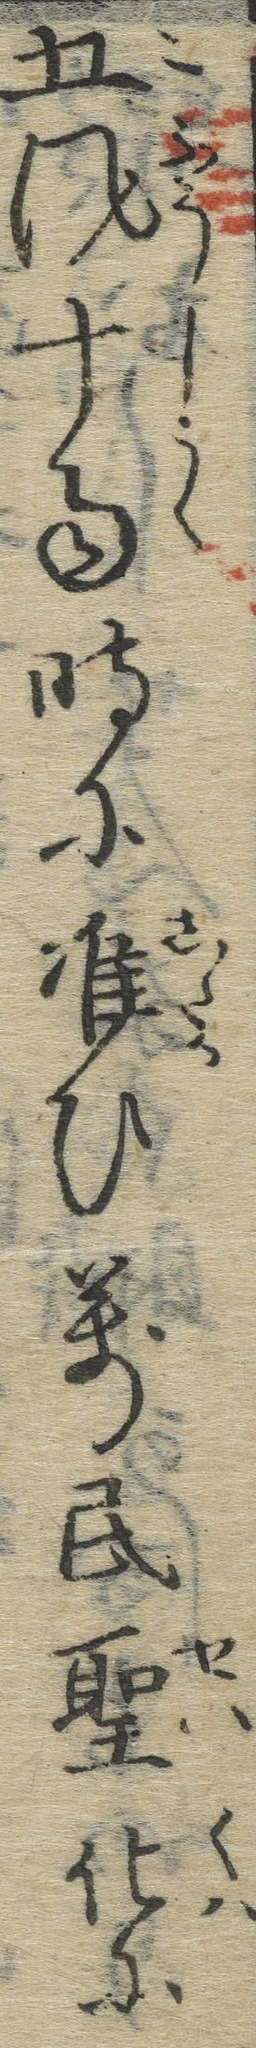五風十雨時に准ひ萬民聖化に
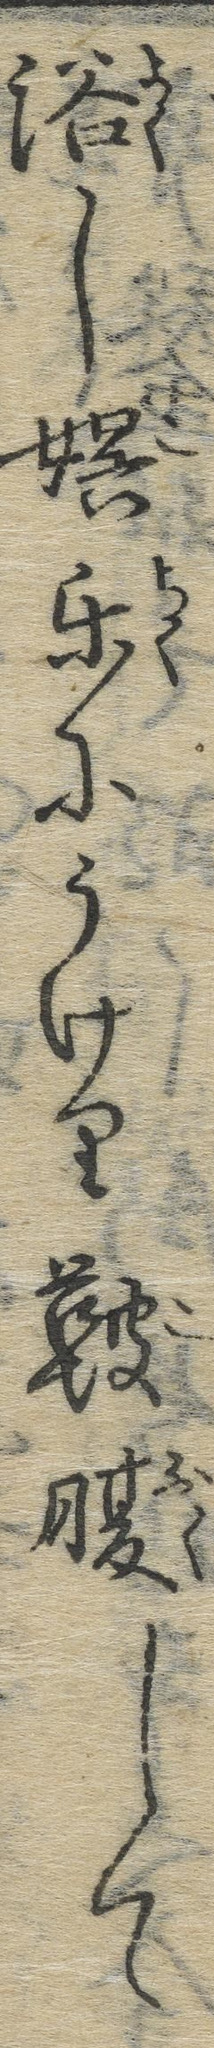浴し娯楽にうけり鼓腹して
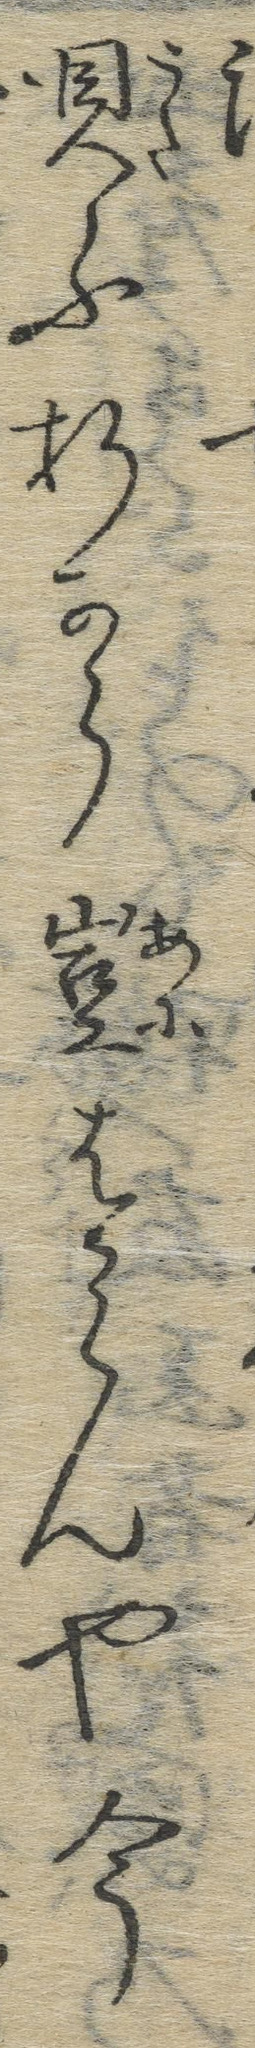唄ふ折から豈はからんや今
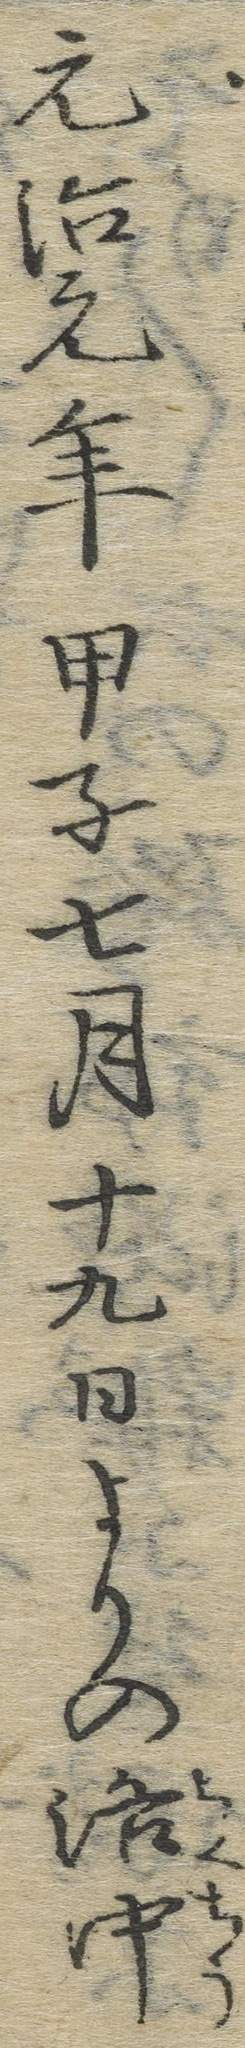元治元年甲子七月十九日よりの洛中
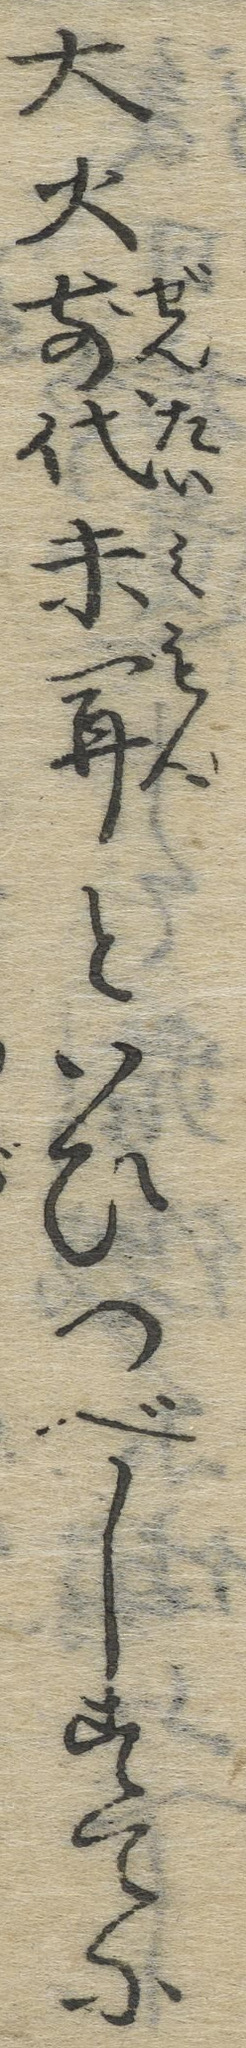大火前代未聞といひつべしすてに
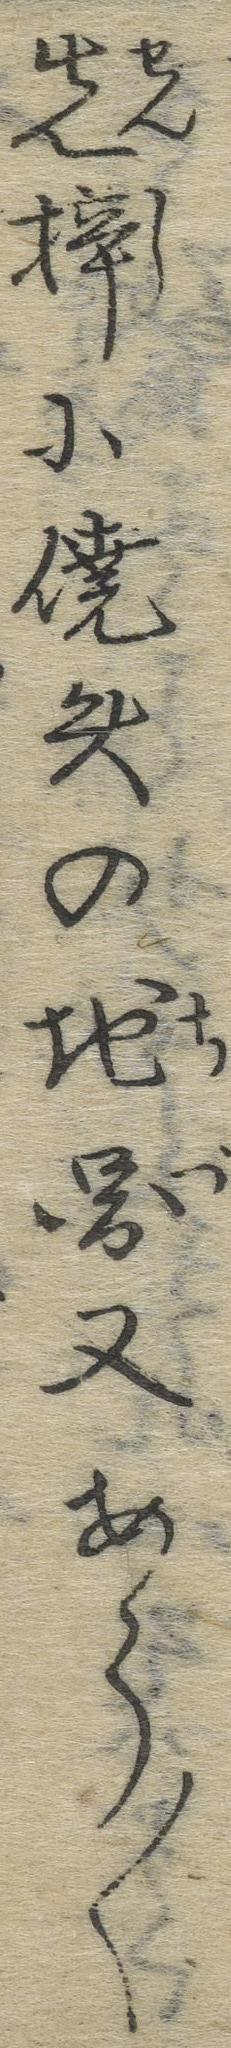先梓に焼失の地圖又あら〳〵
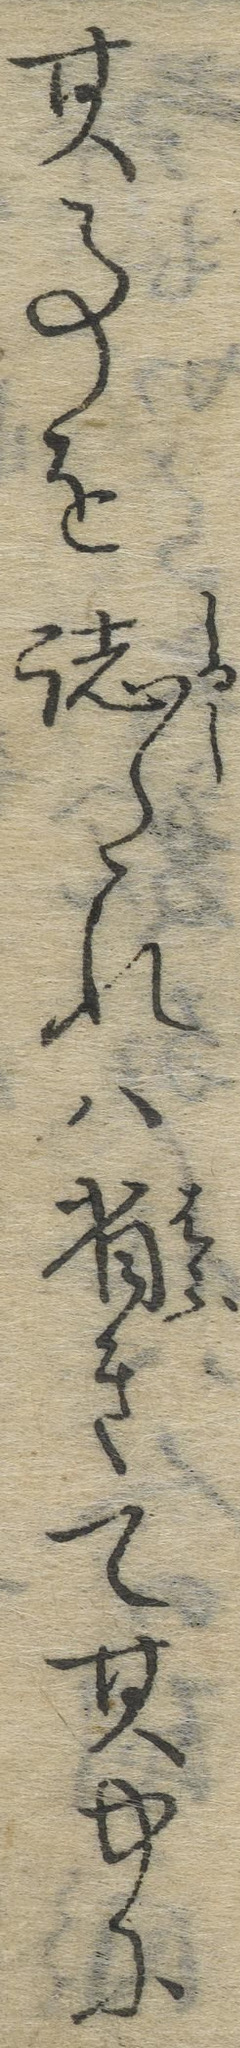其事を誌たれは省きて其中に
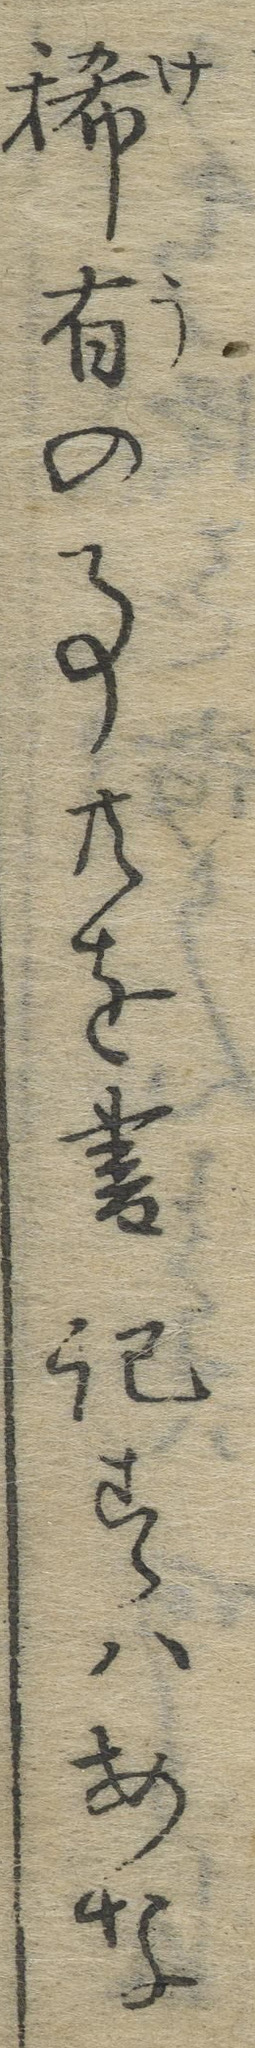稀有の事共を書記すはあな

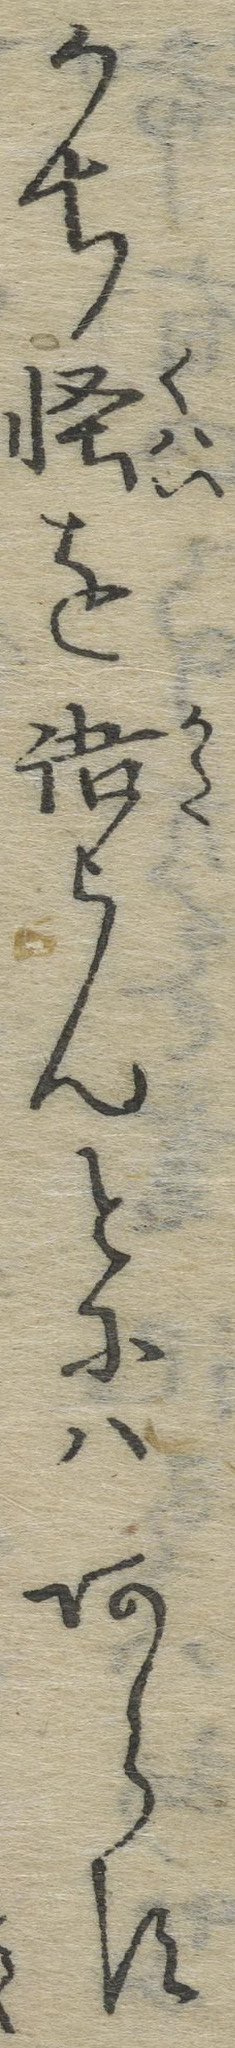かち怪を語らんとにはあらす
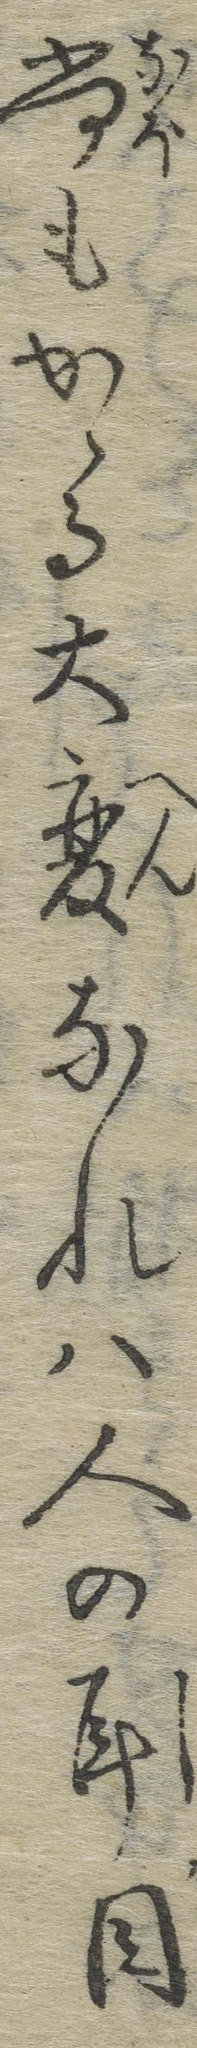尚もかゝる大変なれは人の耳目
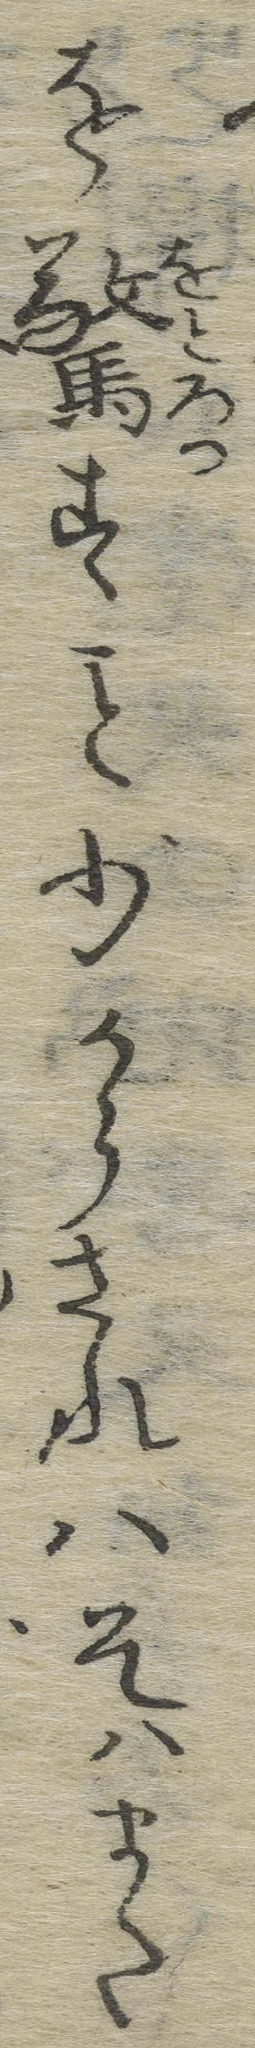を驚すこと少からされはそはまた
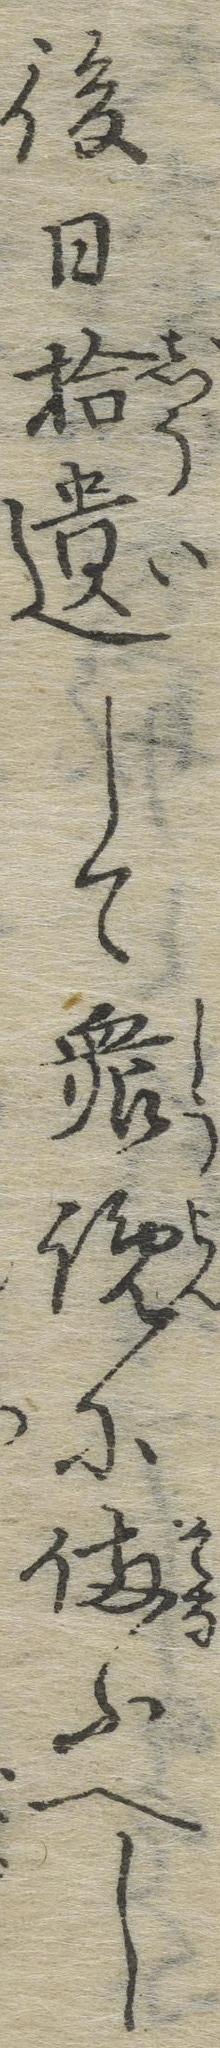後日拾遺して衆覧に備ふへし
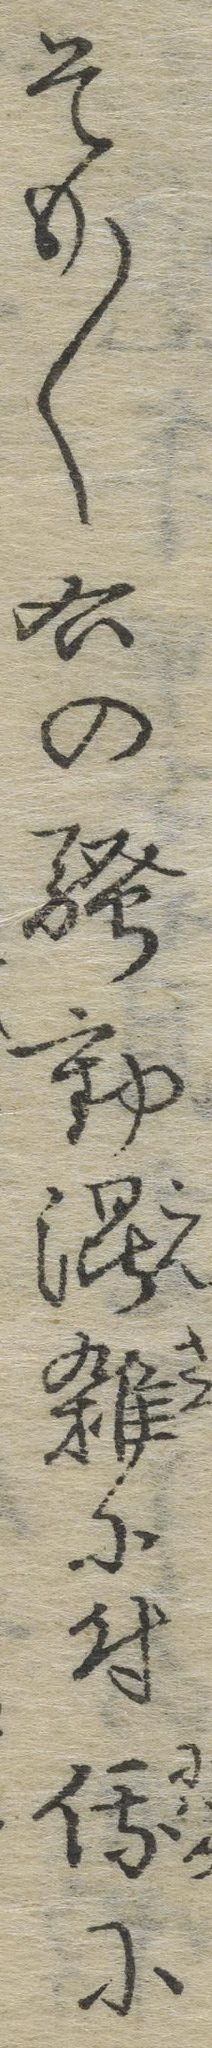そも〳〵右の騒動混雑に付俄に
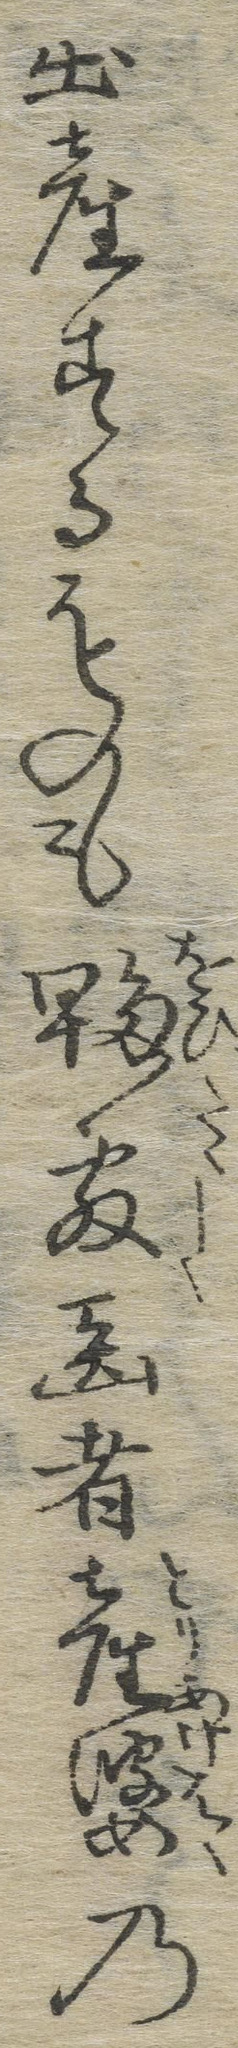出産するものも夥敷医者産婆の
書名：あきの日照
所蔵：東京大学地震研究所図書室 Earthquake Research Institute Library, The University of Tokyo, JAPAN
